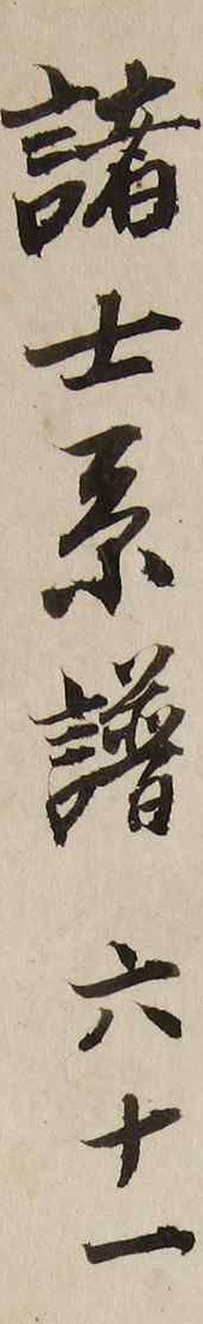諸士系譜六十一

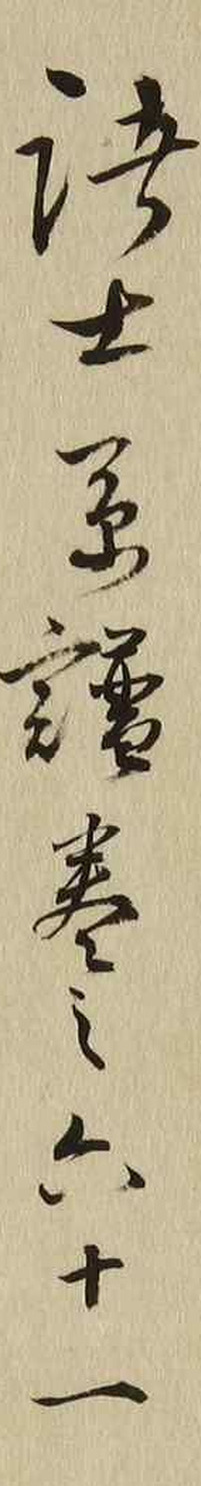諸士系譜巻之六十一
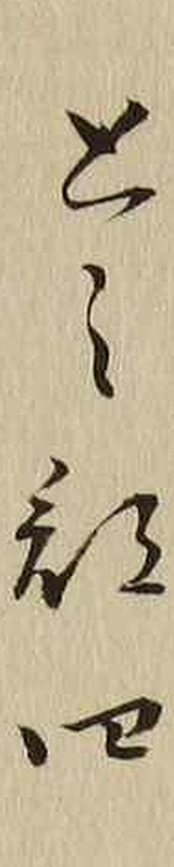と之部四
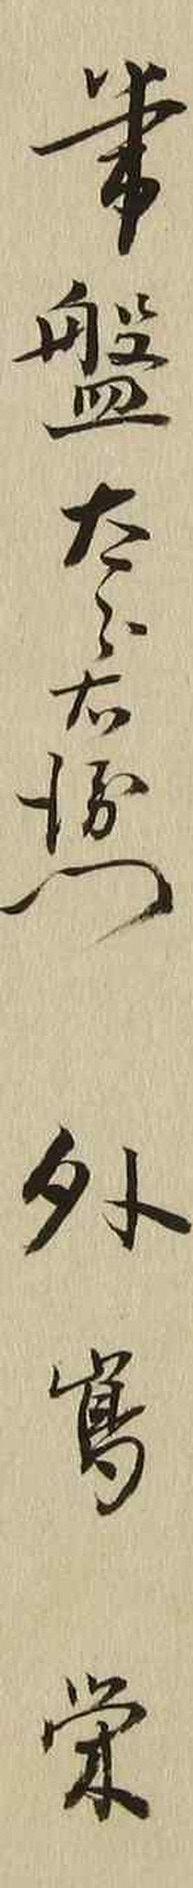常盤太郎右衛門外嶌栄

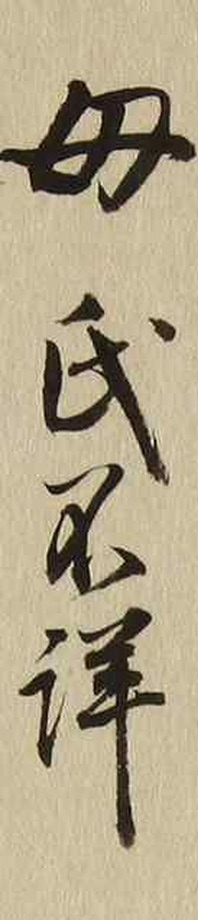母氏不詳
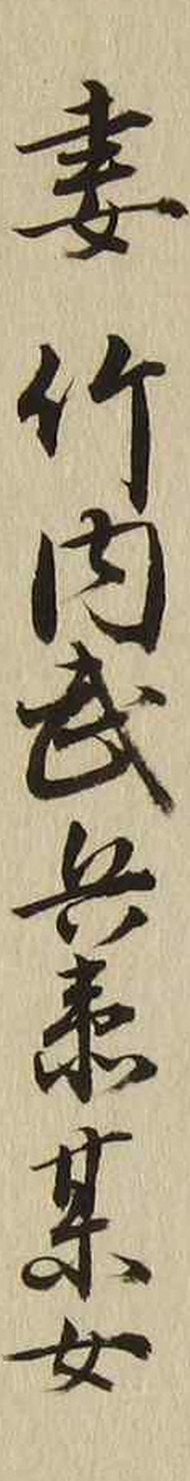妻竹内武兵衛某女
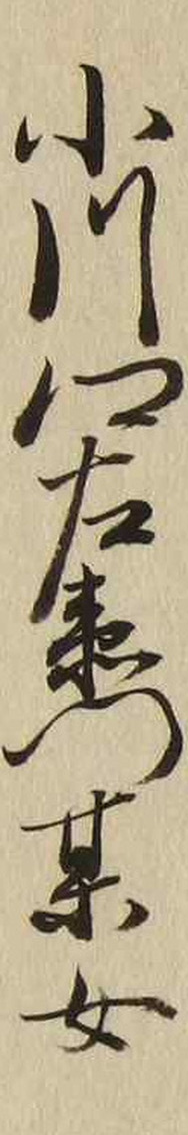小川郷右衛門某女

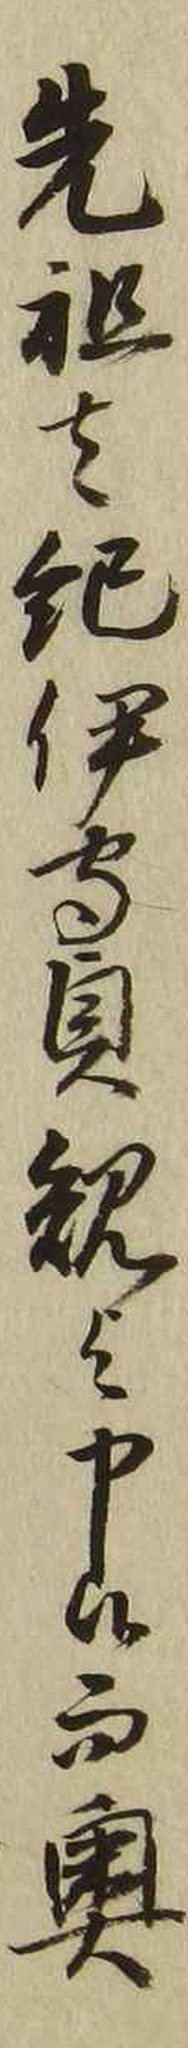先祖は紀伊守貞親与申候而奥
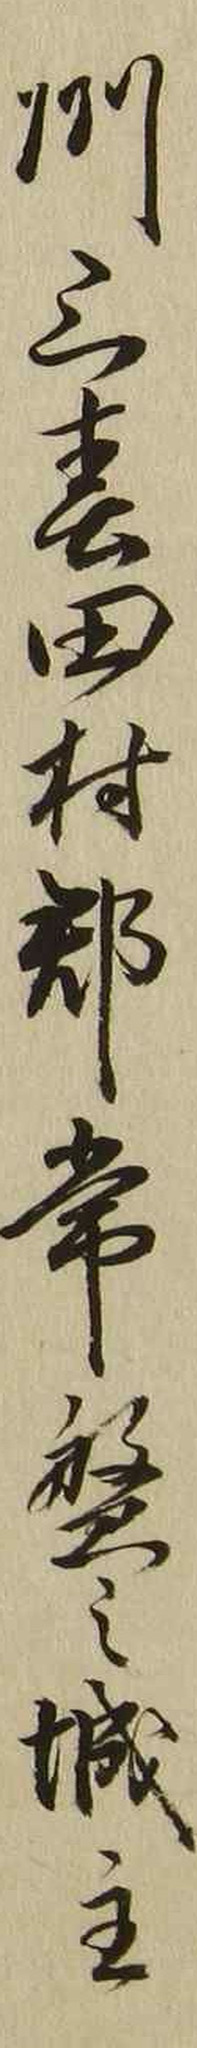州三春田村郡常盤之城主
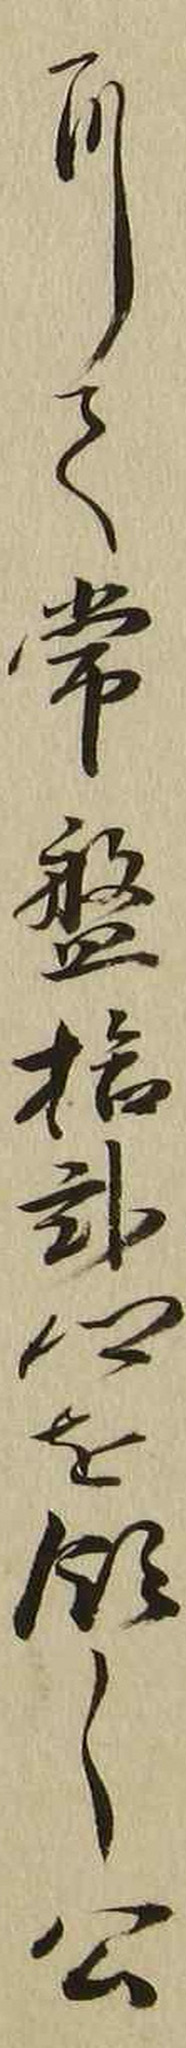にて常盤拾弐郷を領し公
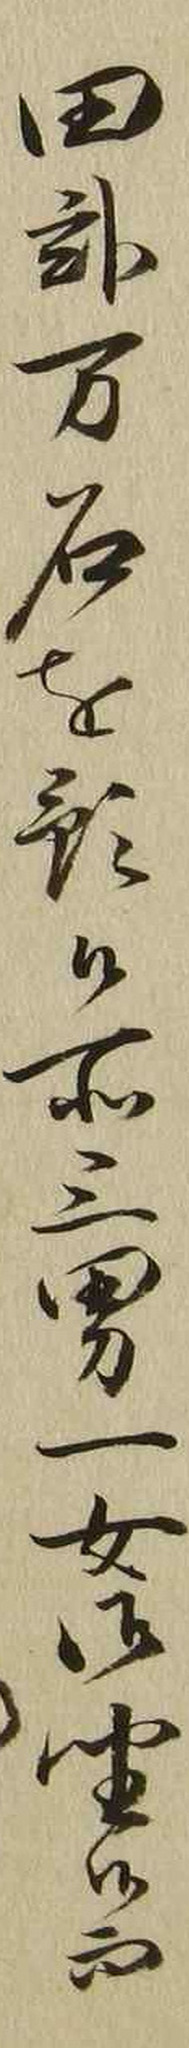田弐万石を預候所三男一女御坐候而
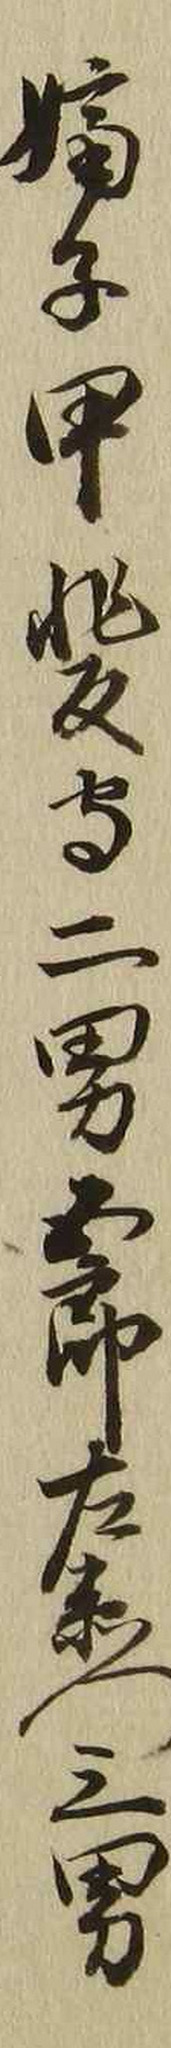嫡子甲斐守二男五郎左衛門三男
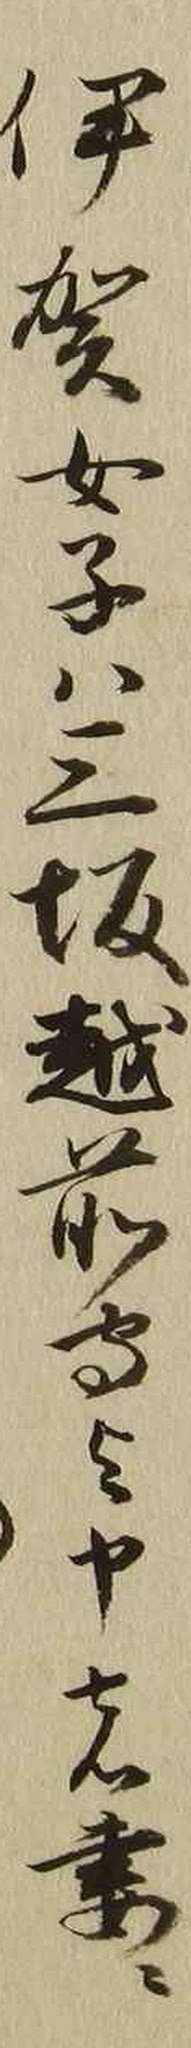伊賀女子ハ三坂越前守与申者妻ニ
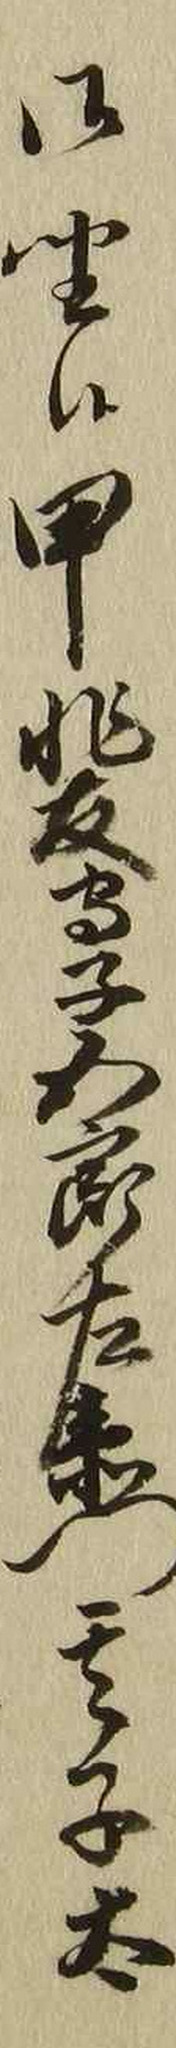御坐候甲斐守子五郎左衛門其子太
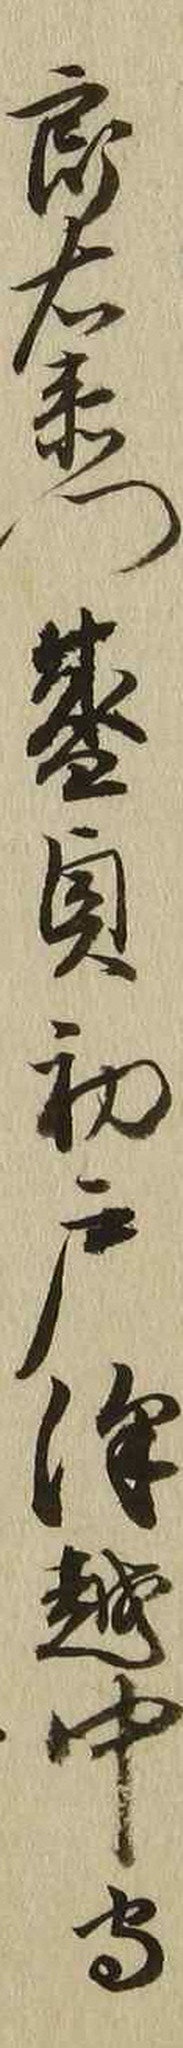郎右衛門盛貞初戸沢越中守
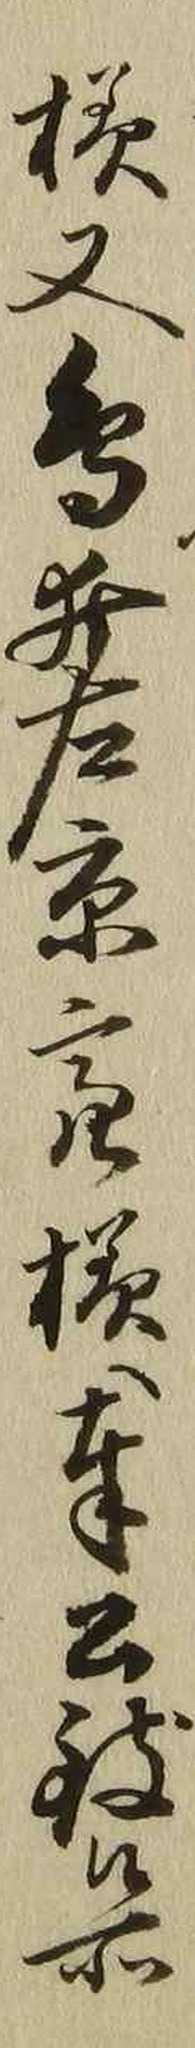様又鳥井右京亮様へ奉公致候所
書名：諸士系譜　巻之61　と之部4
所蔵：会津若松市立会津図書館
